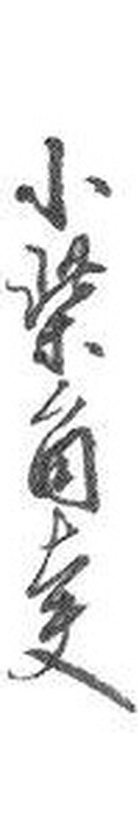小柴角太夫
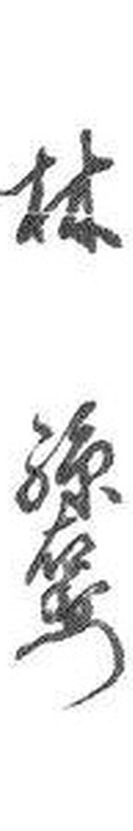林孫右衛門
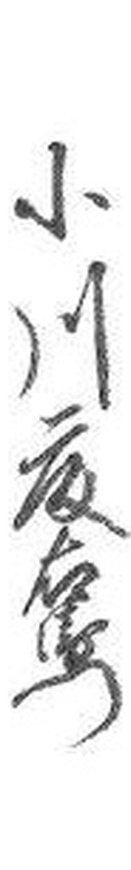小川藤右衛門
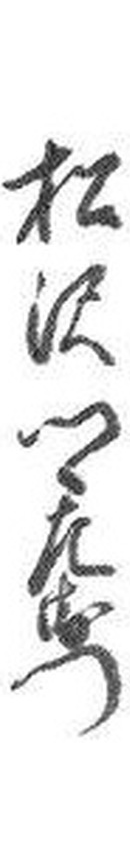松沢郷左衛門
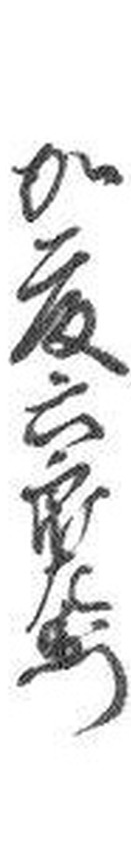加藤六郎左衛門
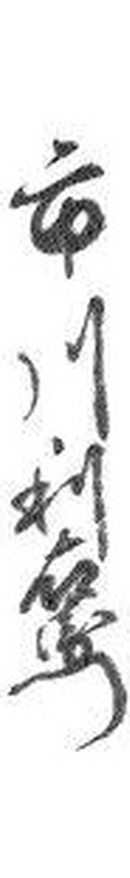市川利右衛門
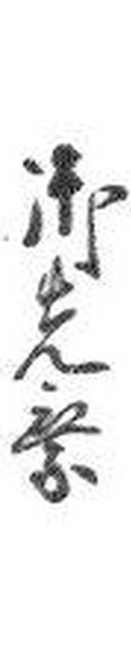御先乗
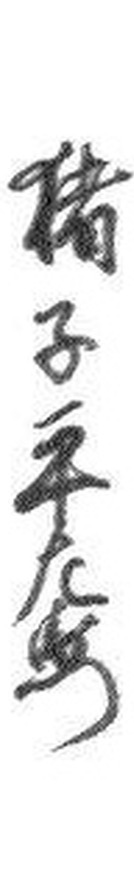猪子平左衛門
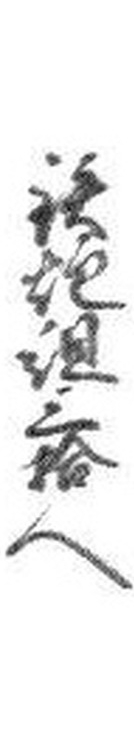鉄炮組三拾人
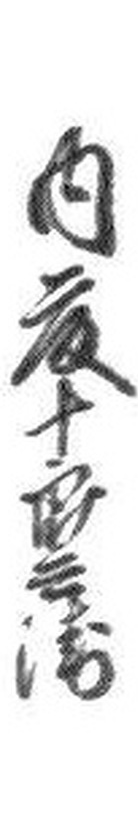内藤十郎兵衛
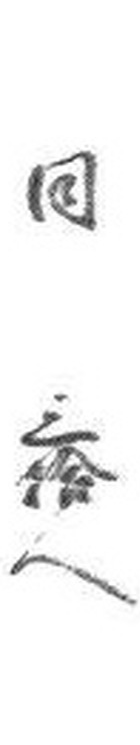同三拾人
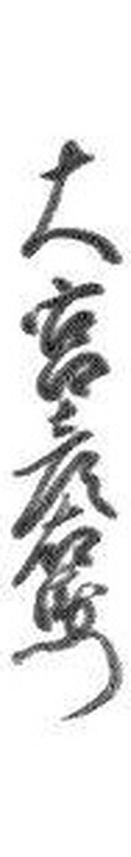大宮彦右衛門
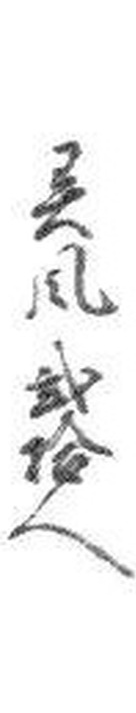異風二拾人
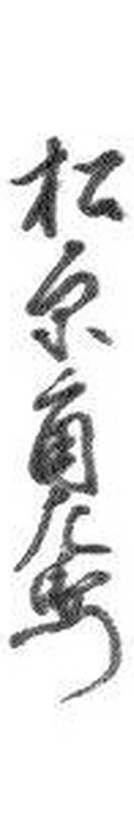松原角左衛門
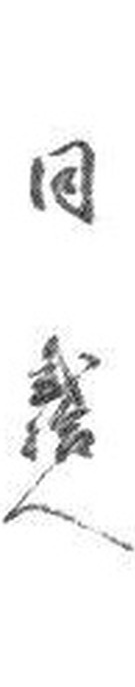同三拾人

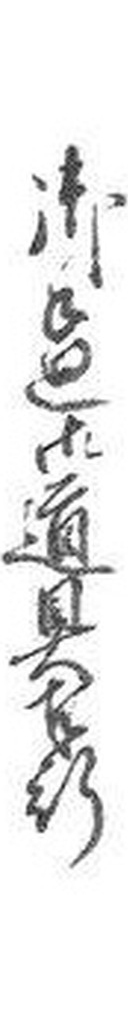御手廻御道具奉行
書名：家譜 四 忠昌公 従寛永七年到正保四年
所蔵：福井県文書館 Fukui Prefectural Archives
